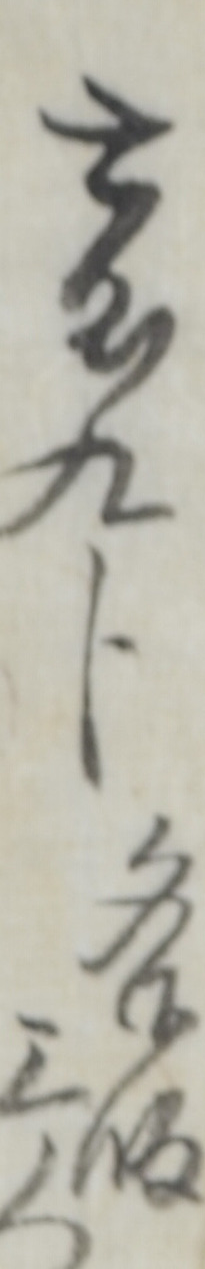一六匁九分夕御飯
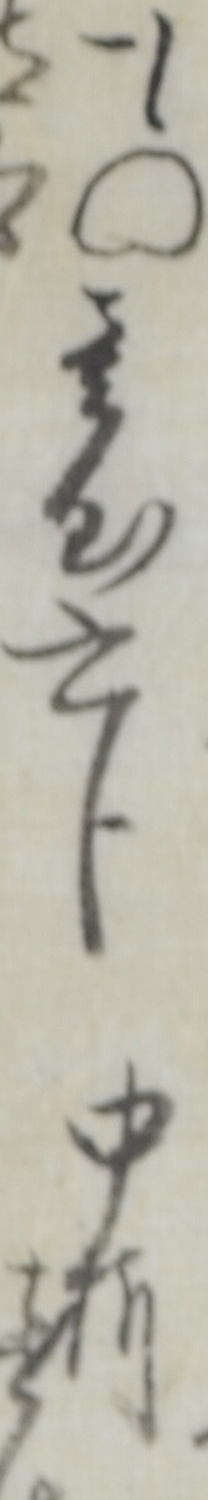一壱匁六分中折
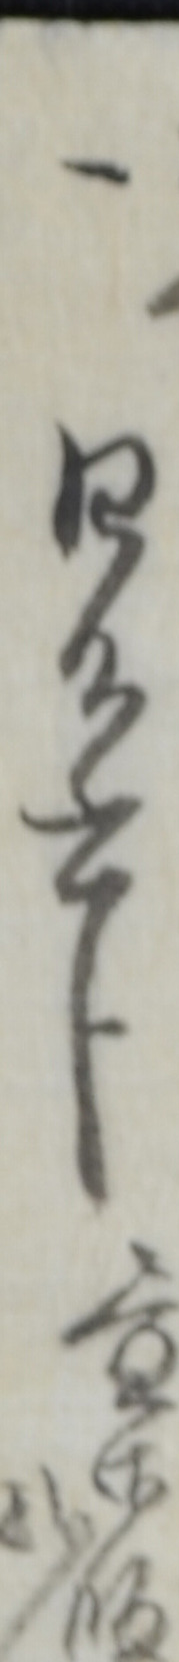一四匁六分昼御飯
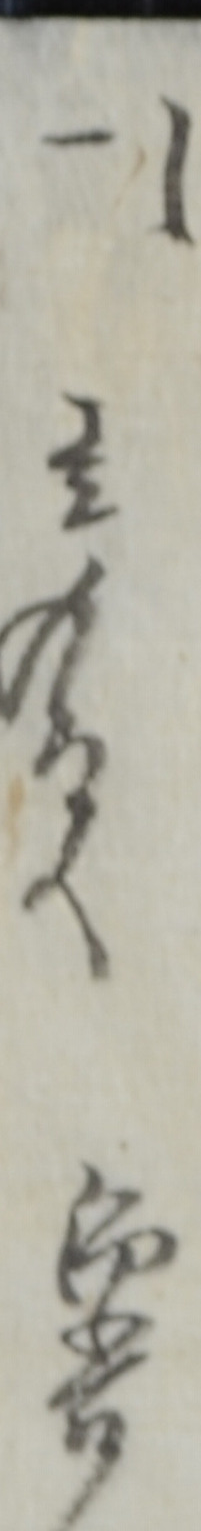一壱貫百文酒肴〆

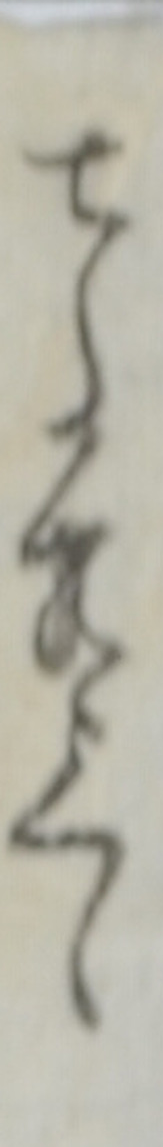七月廿三日
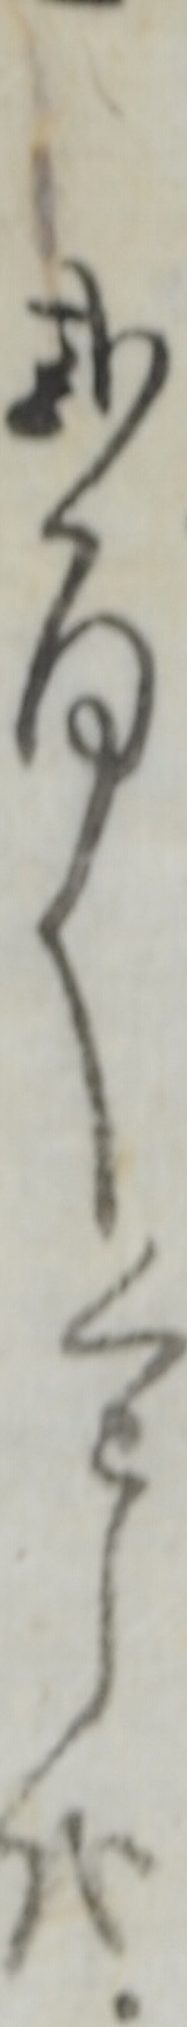一弐百文くわし代
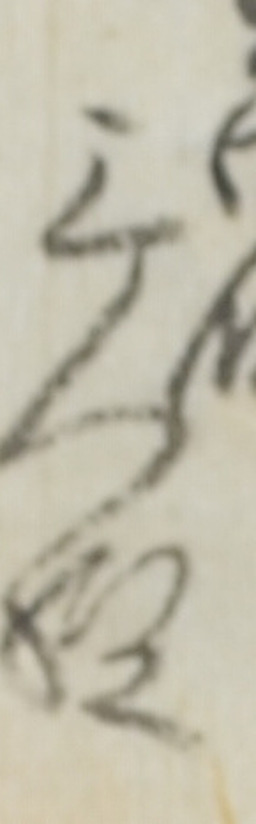三人様
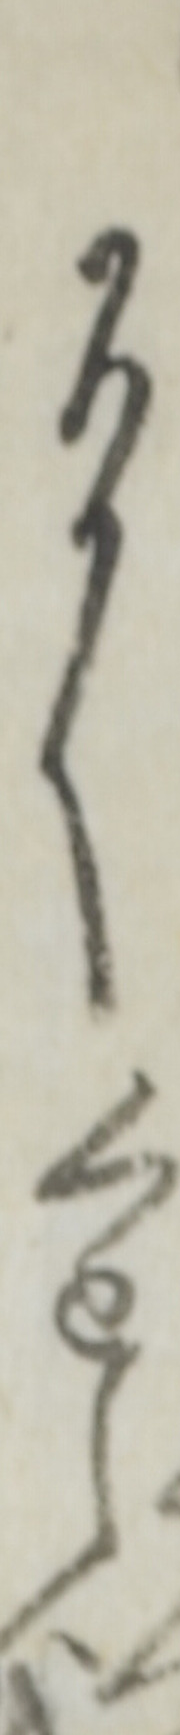一百文くわし代
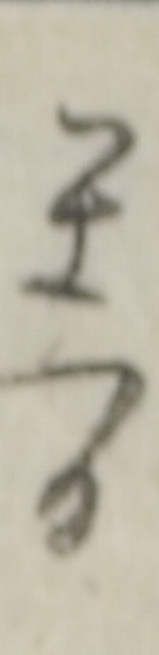廿四日
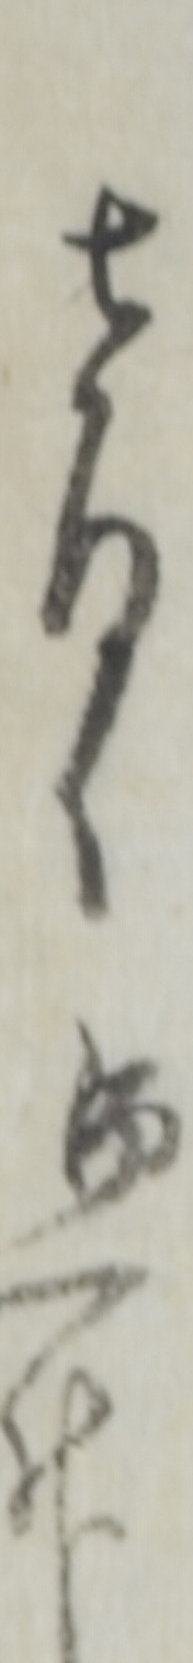一七百文酒一升

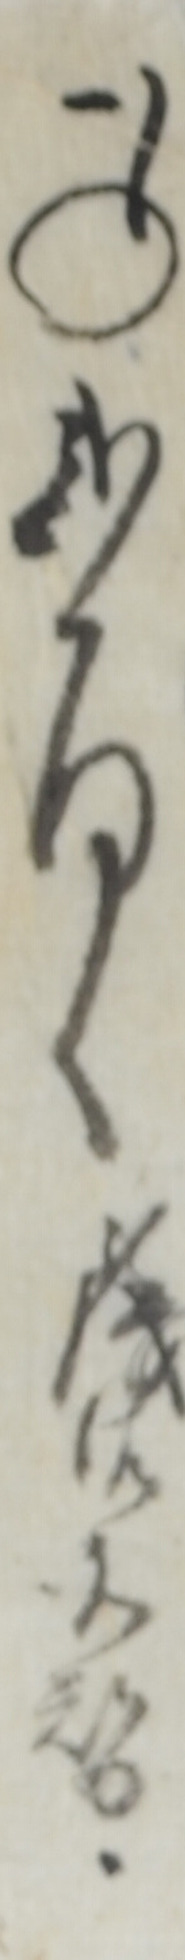一○弐百文銭御取替
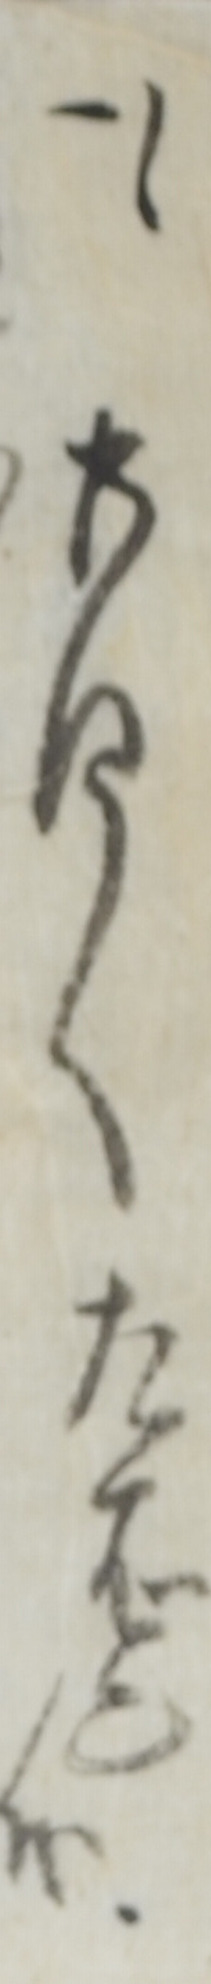一廿四文たばこ
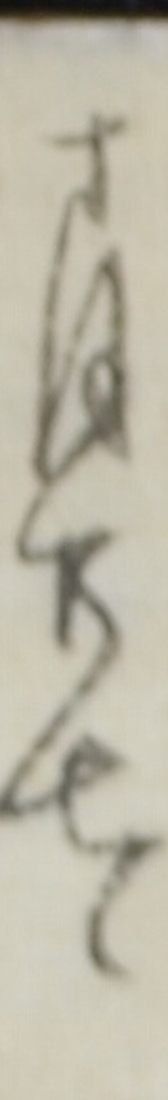十月廿七日
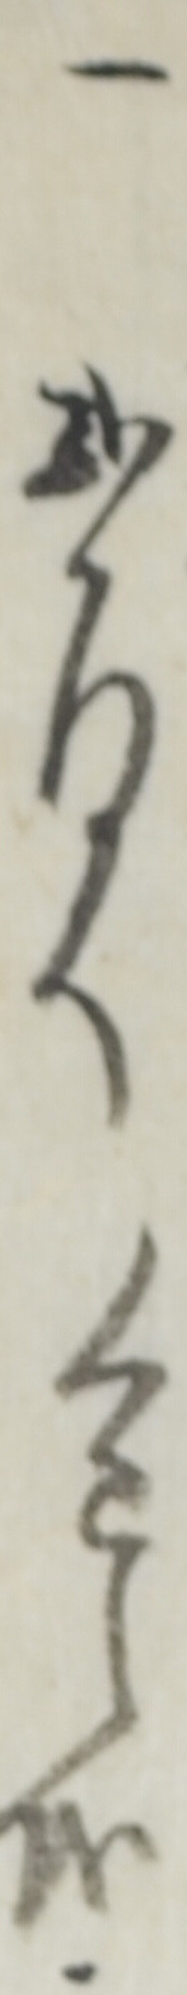一弐百文くわし
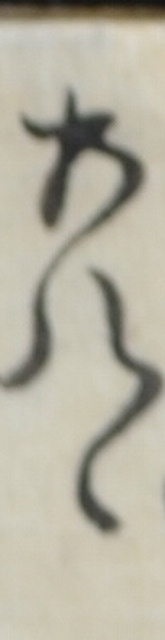廿八日
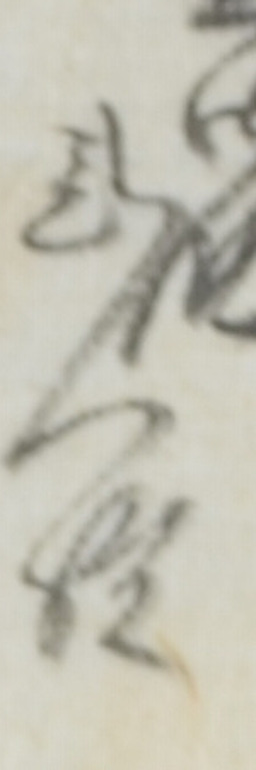弐人様
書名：（金銭書上控）
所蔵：伊那市立高遠町図書館・合同会社AMANE
